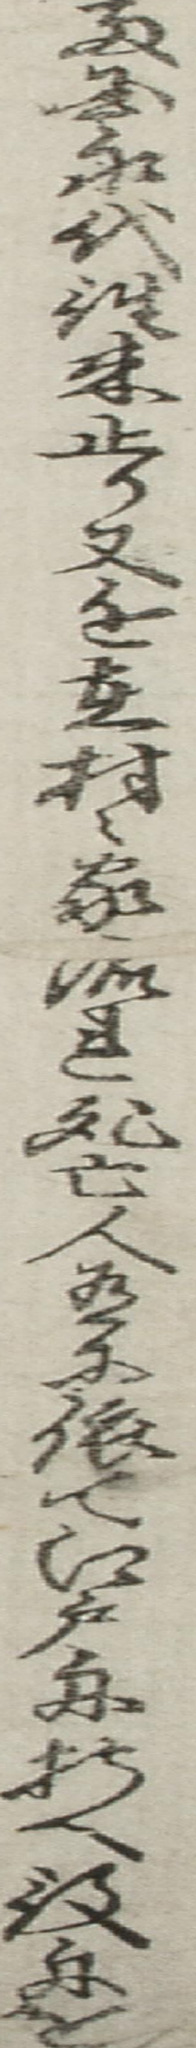両国永代往来止り又近在村〻家流れ死亡人有に依て江戸舟持へ役舟を
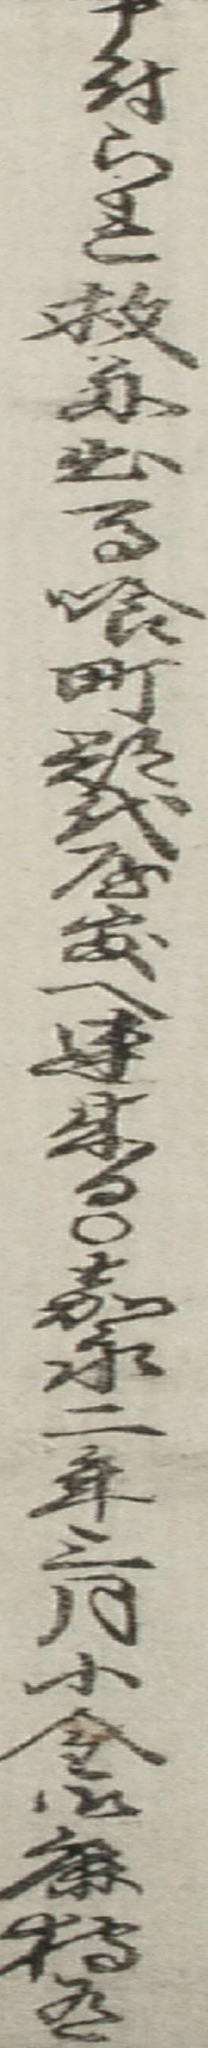申付られ救船出馬喰町郡代屋敷へ連来る〇嘉永二年三月小金御鹿狩有
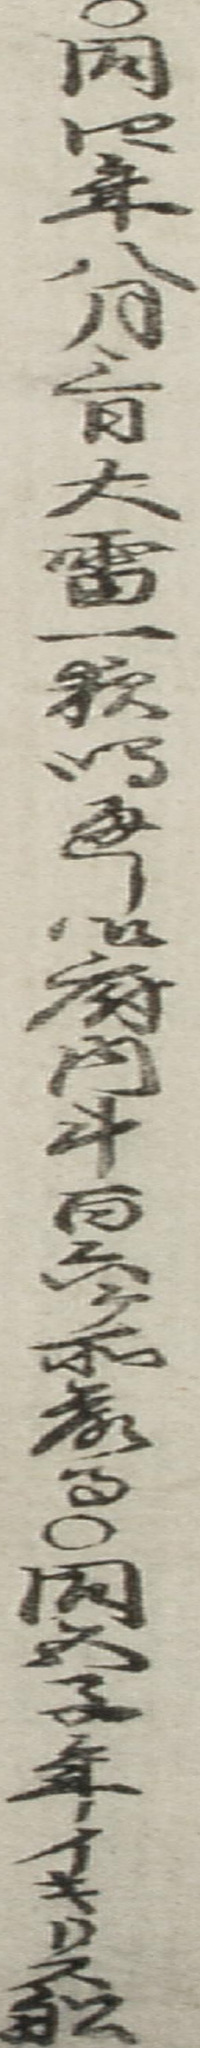〇同四年八月三日大雷一夜鳴通し御府内計百六ケ所落る△同五子年イキリス船
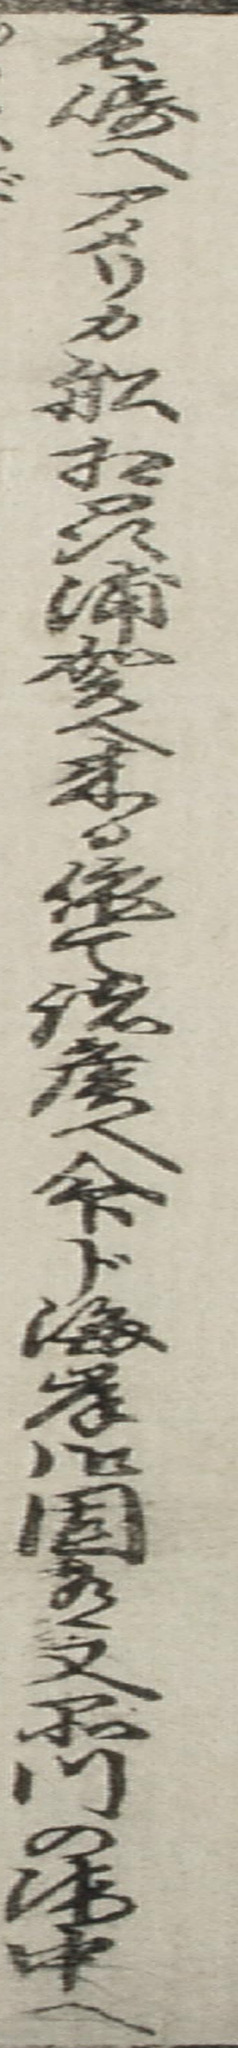長崎へアメリカ船相州浦賀へ来る依て諸侯へ命じ海岸御固有又品川の海中へ
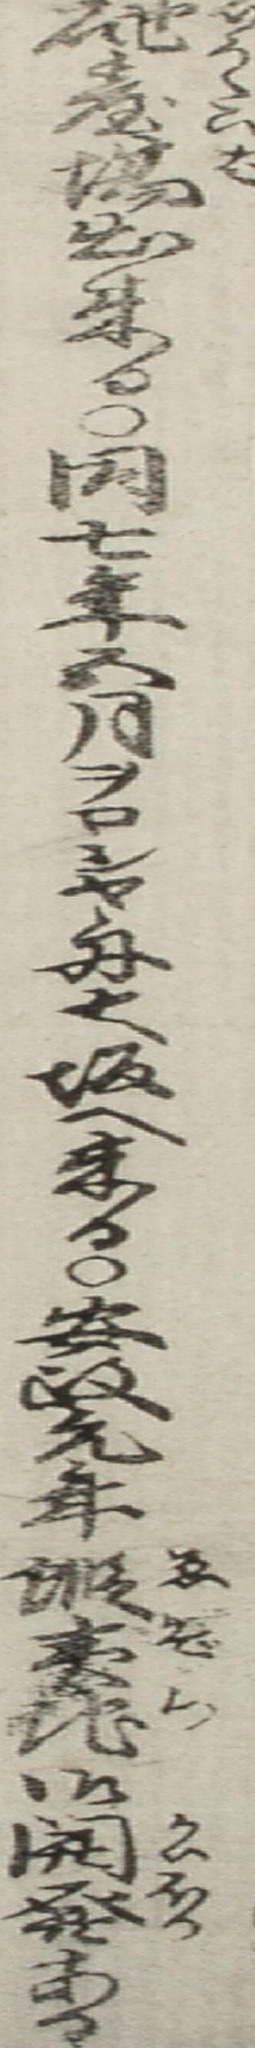砲台場出来る〇同七年五月ヲロシヤ舟大坂へ来る〇安政元年蝦夷地御開発ある
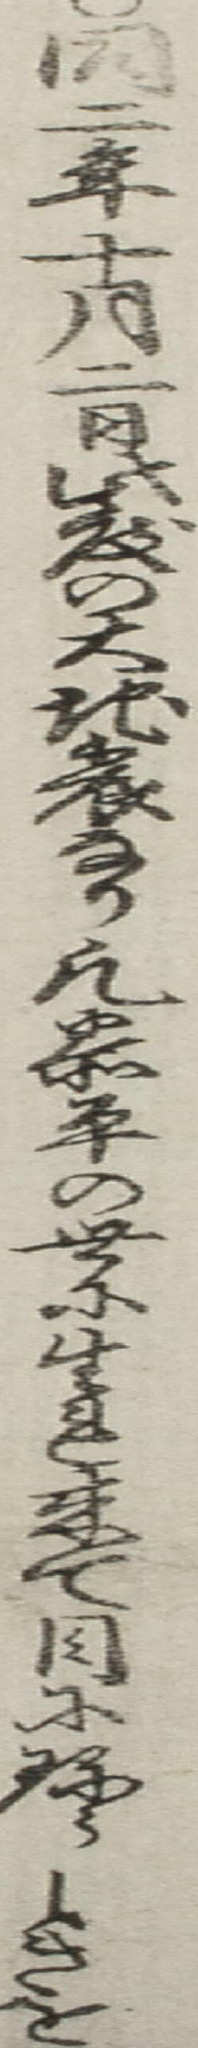〇同二年十月二日此度の大地震なり凡泰平の世に生れ来て目に珍らしきを
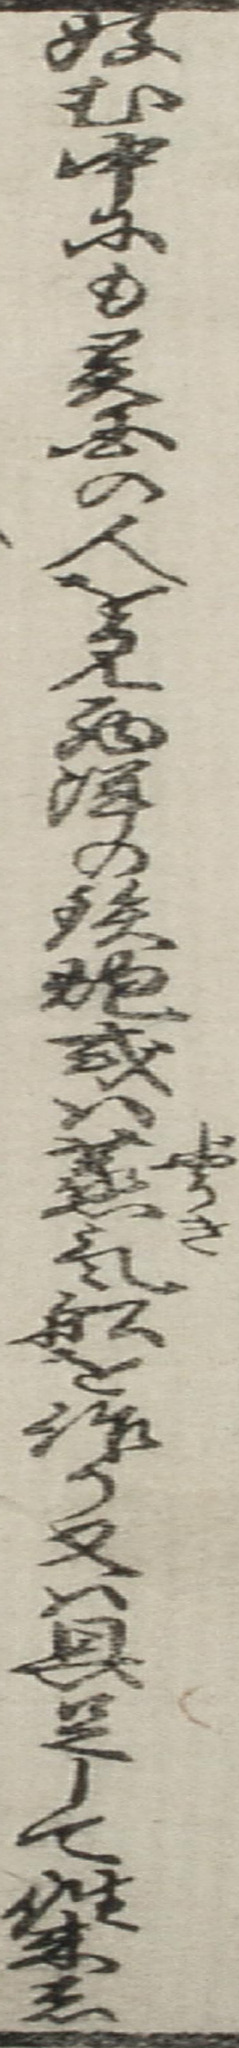好む中にも異国の人を見西洋の鉄炮或は蒸気船を作り又は具足して往来は
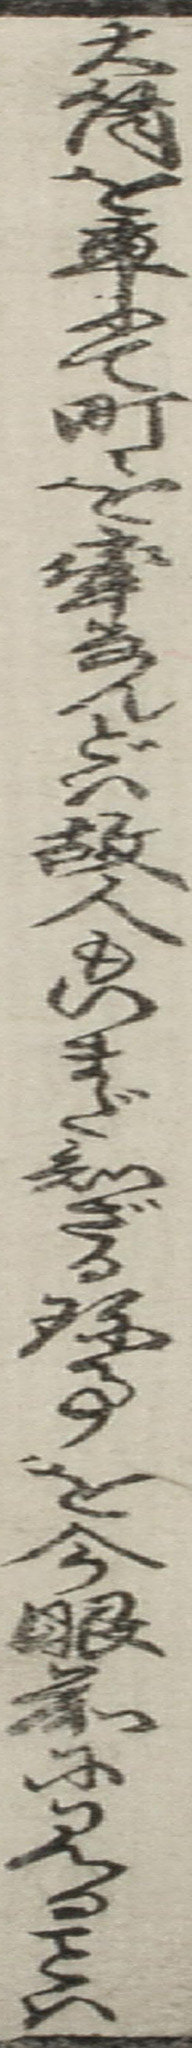大筒を車にて町々を牽なんどは故人もいまだ知ざる珍事を今眼前に見ることは
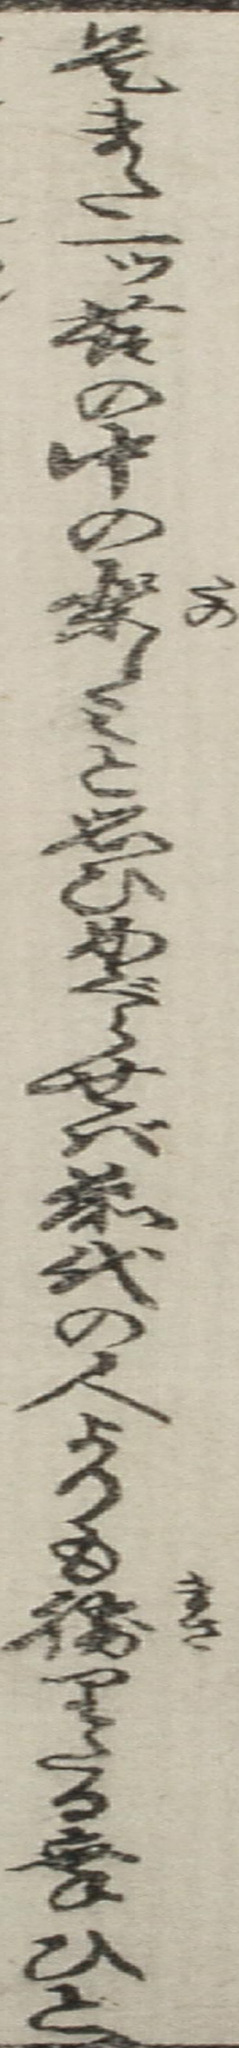是また一ツ苦の中の楽しみと思ひめぐらせば前代の人よりも勝りたる幸ひと
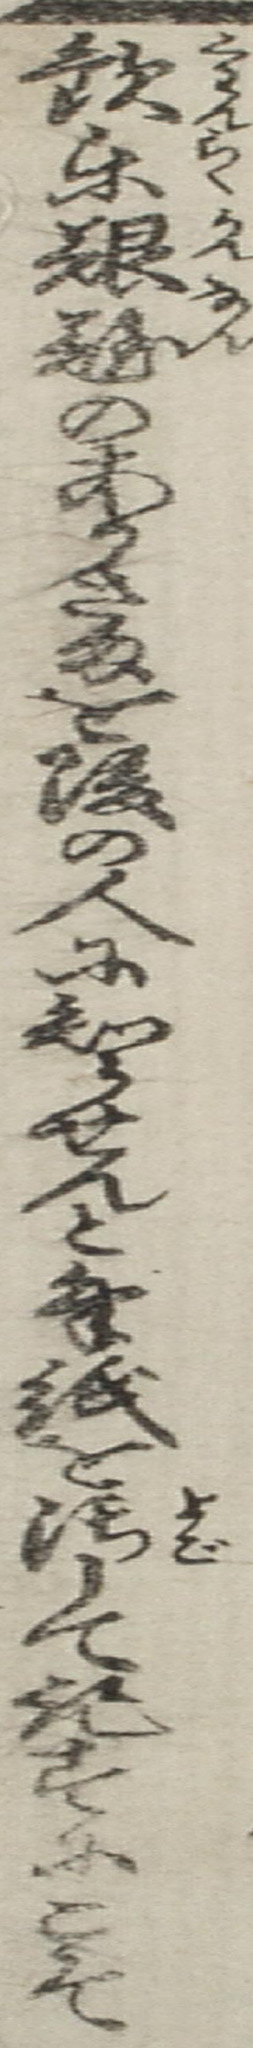歓楽艱難のありさまを後の人に知らせんと半紙を汚して記すにこそ
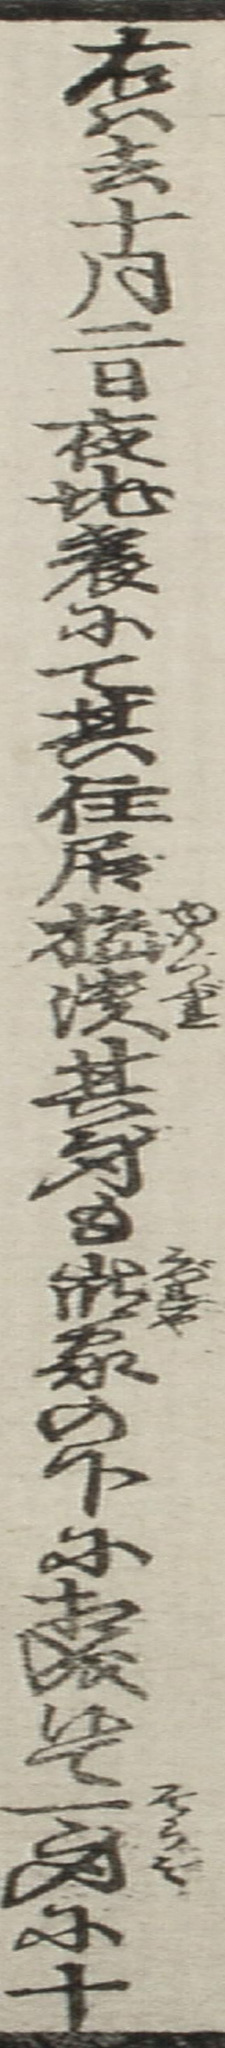右は去十月二日夜地震にて其住居揺潰其身も崩家の下に相成候て一身に十
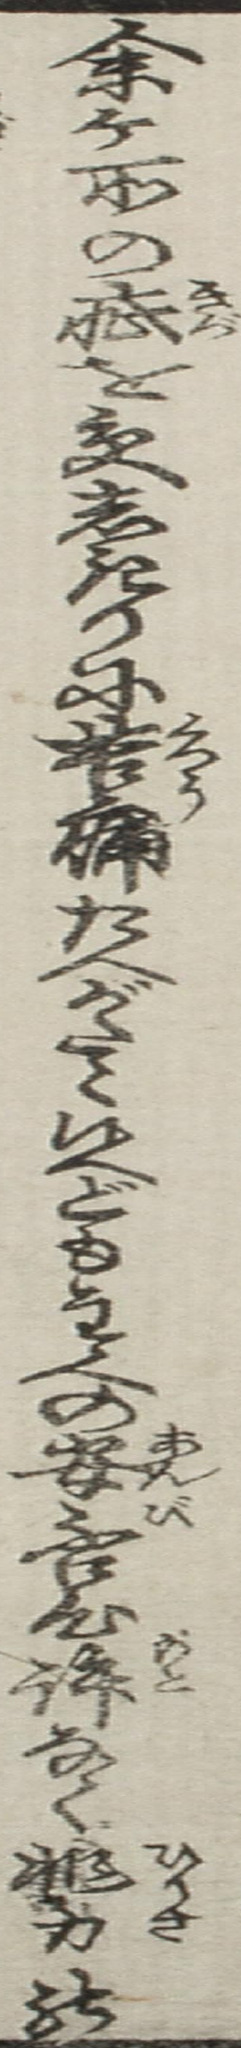余ケ所の疵を受しきりに苦痛たへがたく候へども主人の安否心許なく非力の
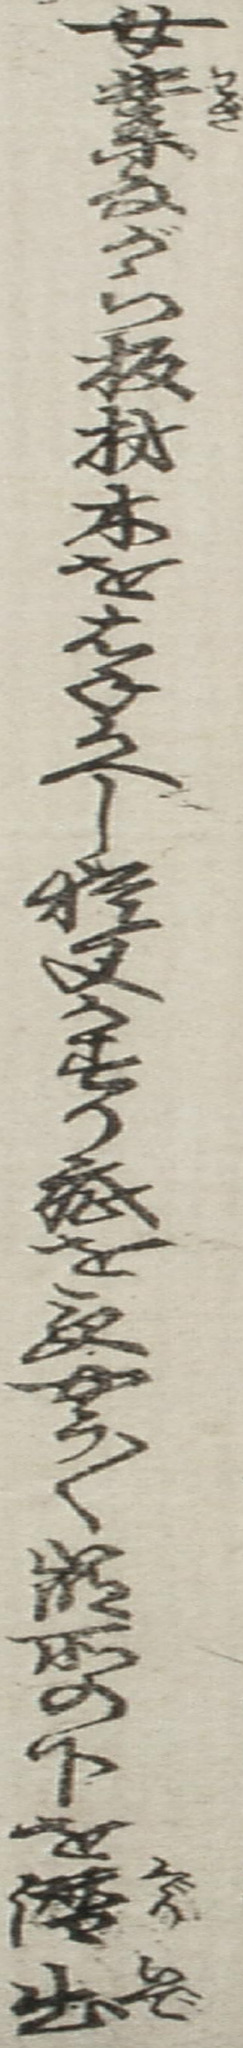女業ながら板材木をはねかへし猶又かすり疵を受やう〳〵崩所の下を潜出
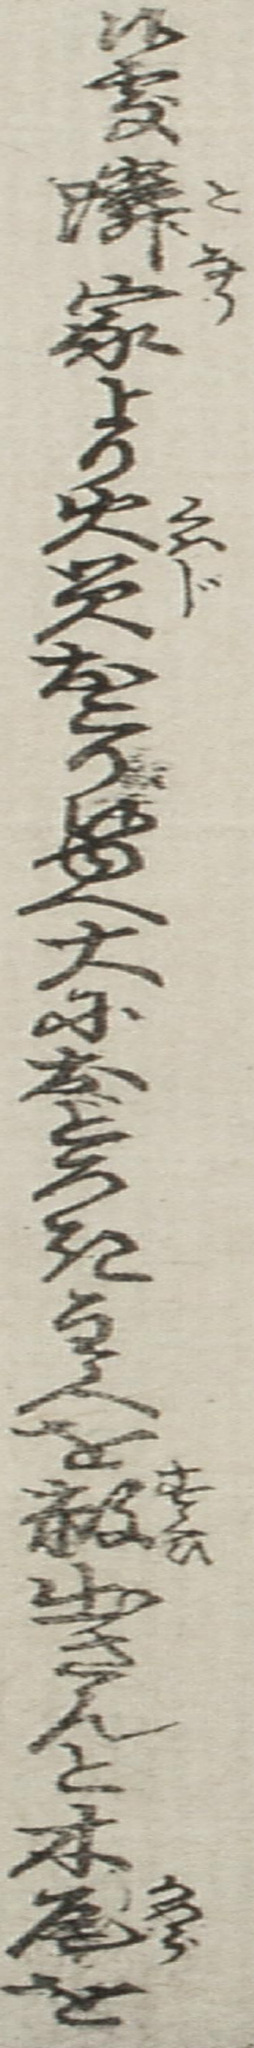候処隣家より火災おこり候ゆへ大におどろき主人を救出さんと木瓦を
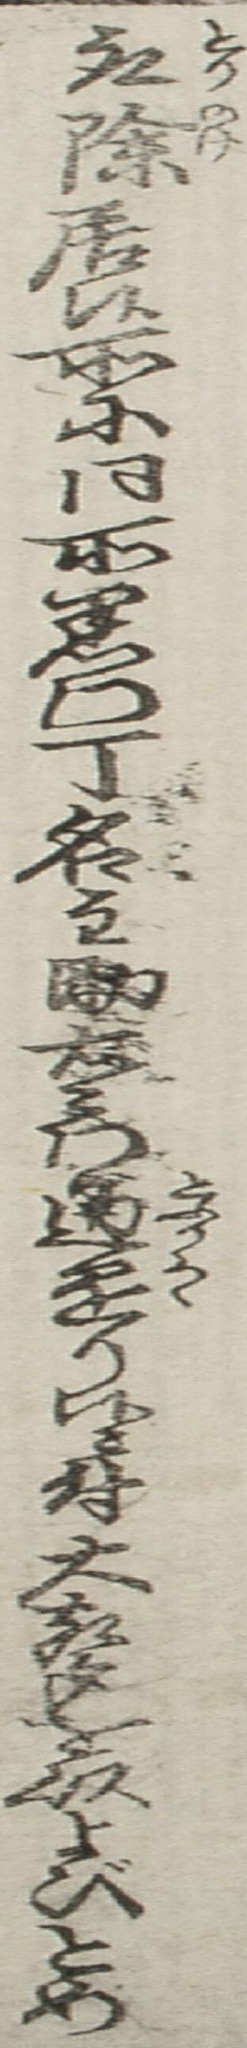取除居候所に同所黒門丁名主助右衛門通懸り候に付大声を以よびとめ
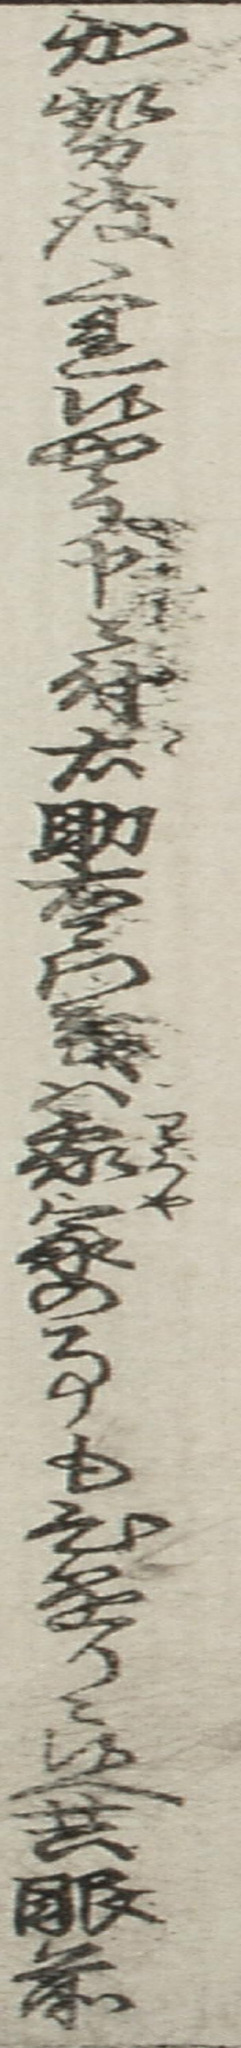加勢致くれ候やう申に付右助右衛門義は我家の事も心懸りに候へ共眼前
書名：安政見聞誌　下
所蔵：東京大学地震研究所図書室 Earthquake Research Institute Library, The University of Tokyo, JAPAN
